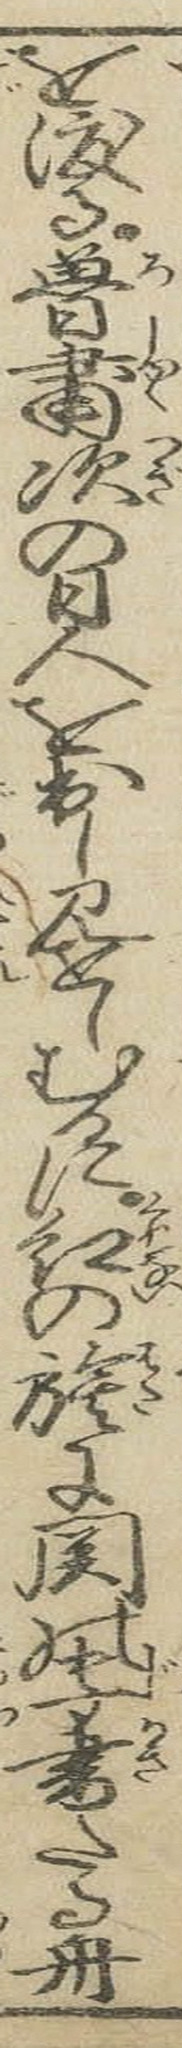を渡る。魯粛次の日人を出し見せしむるに。紅の旗に関の字書たる舟
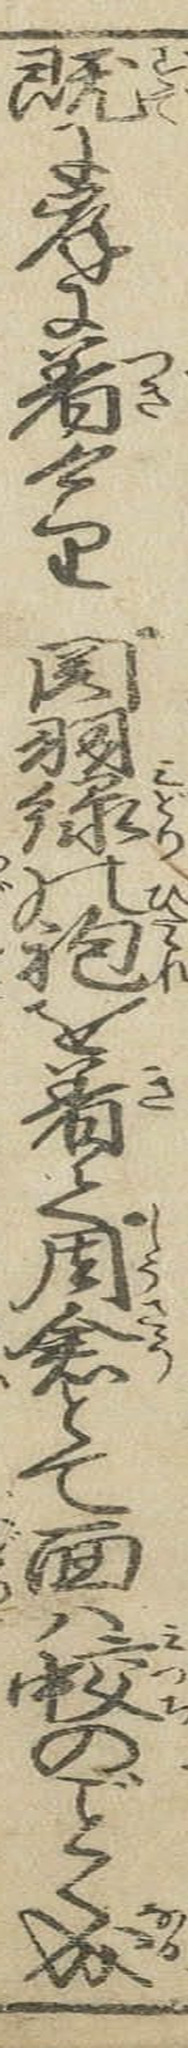既に岸に着けり。関羽緑の袍を着て。周倉とて面は蛟のごとく成
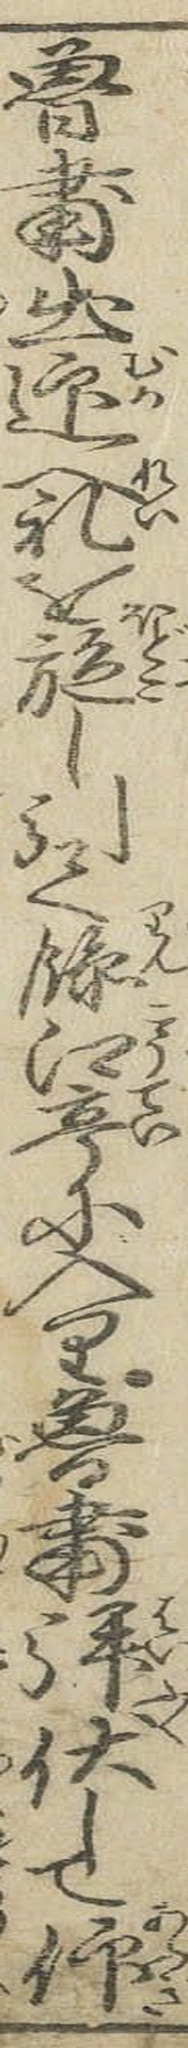魯粛出迎へ礼を施し引て臨江亭に入り。魯粛拝伏して仰
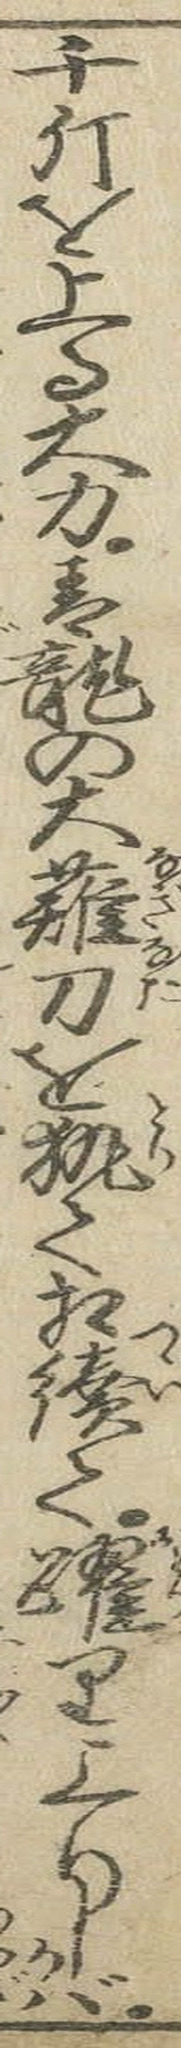千斤を上る大刀。青龍の大薙刀を執て相続て。躍り上りしかば。
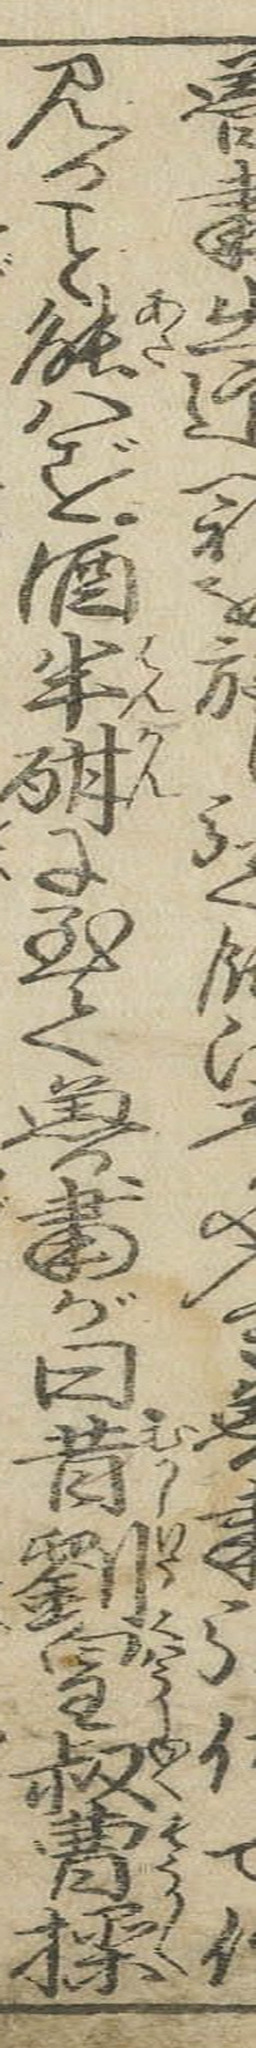見ること能はず。酒半酣に至て魯粛が曰。昔劉皇叔曹操
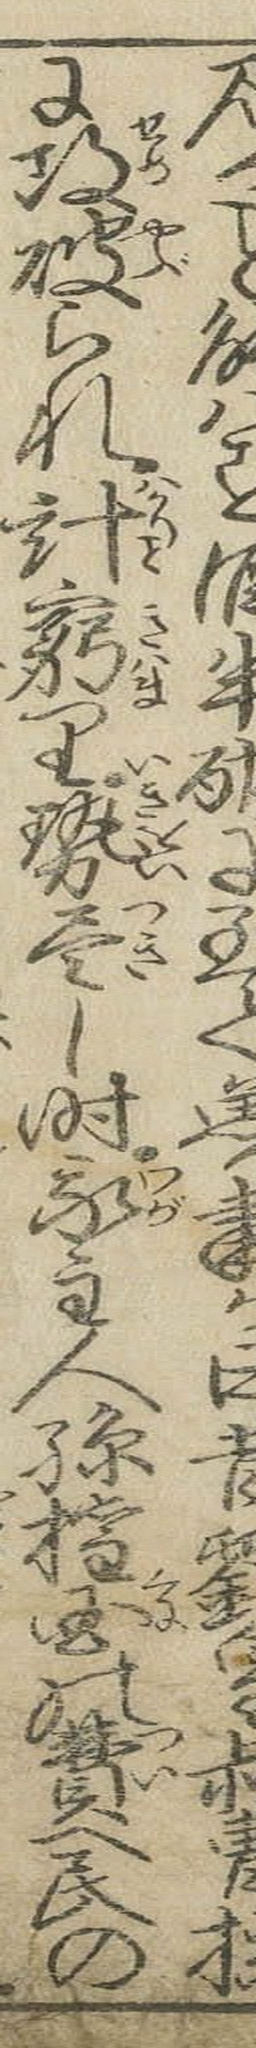に攻破られ。計窮り。勢尽し時。我主人孫権国の費へ民の
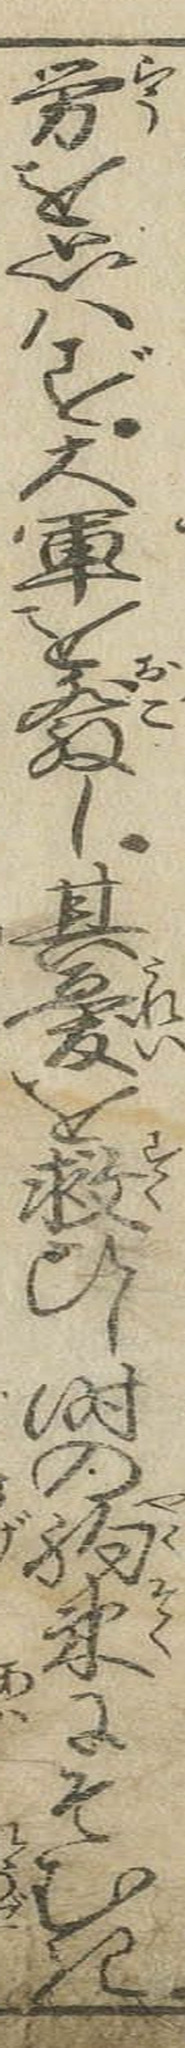労を思はず。大軍を発し。其憂を救ひし時の約束にそむき。
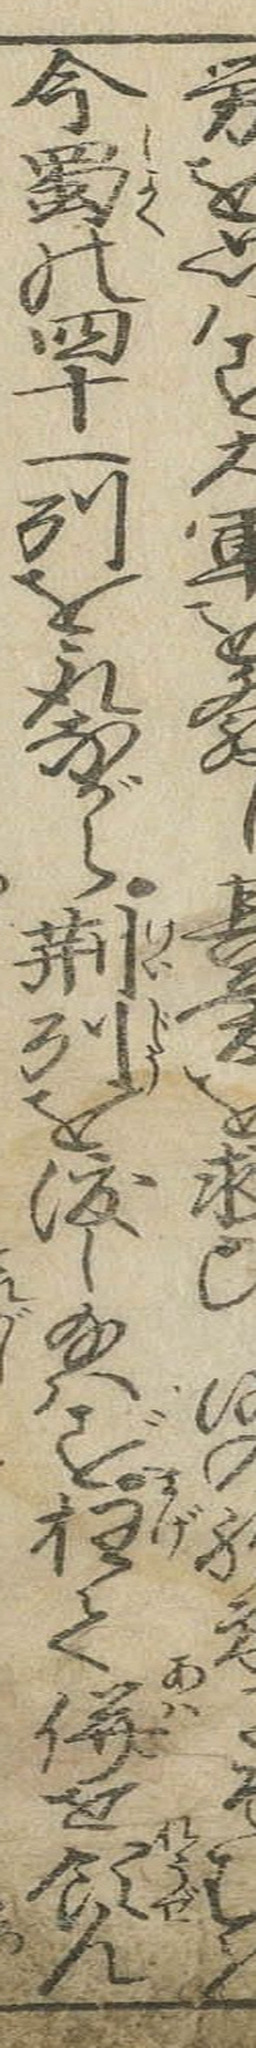今蜀の四十一州を取ながら。荊州を渡し給はず。枉て併せ領ん
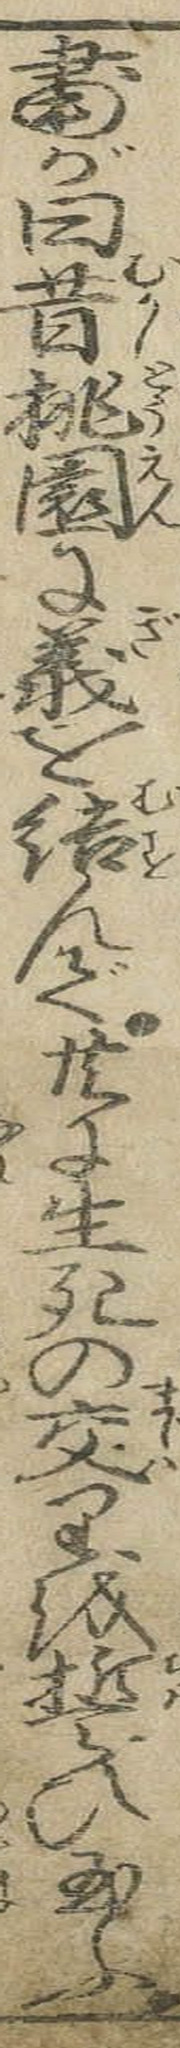粛が曰昔桃園に義を結んで。共に生死の交りを誓ひ玉ふ。
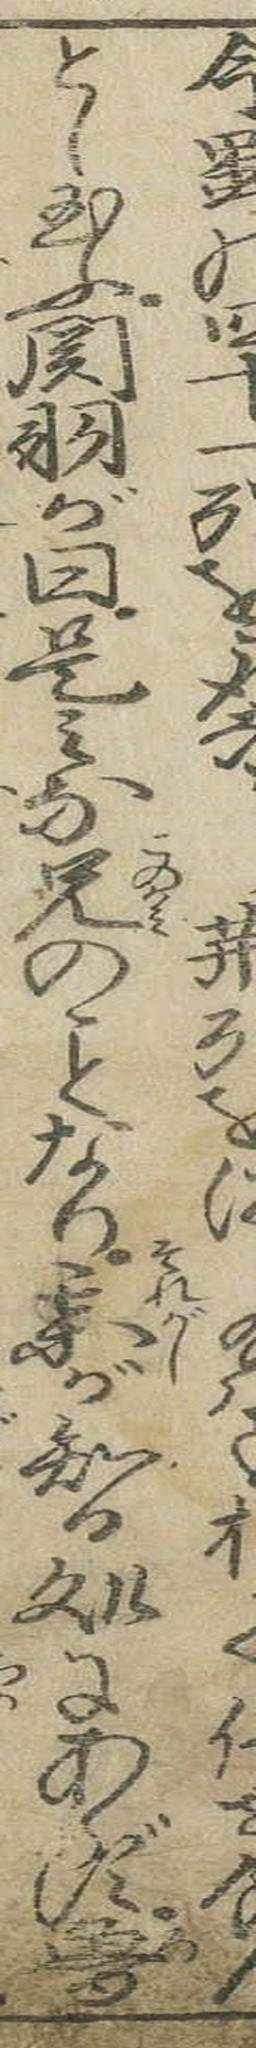とし玉ふ。関羽が曰。是みな兄のことなり。某が知る処にあらず。魯
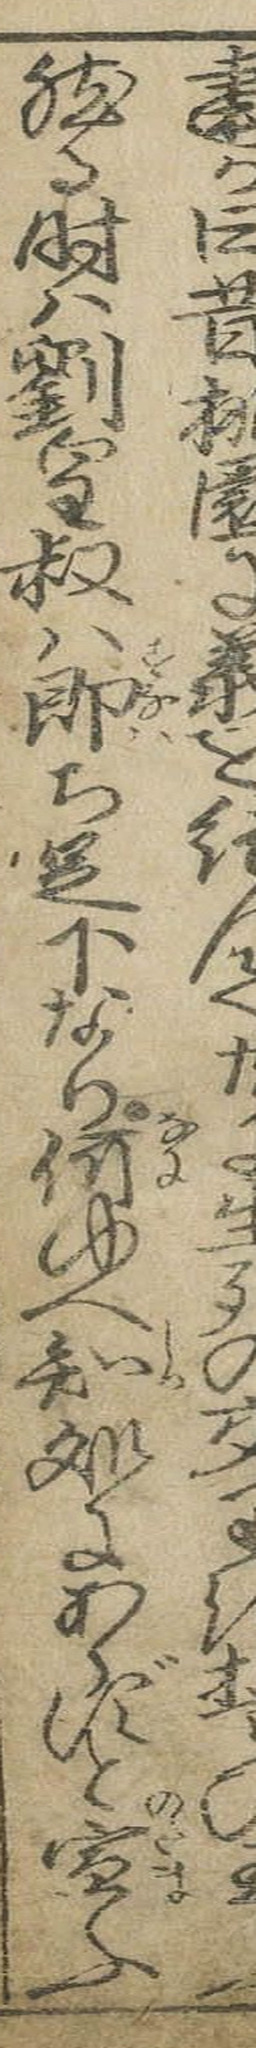然る時は劉皇叔は即ち足下なり。何ゆへ知処にあらずと宣ふ

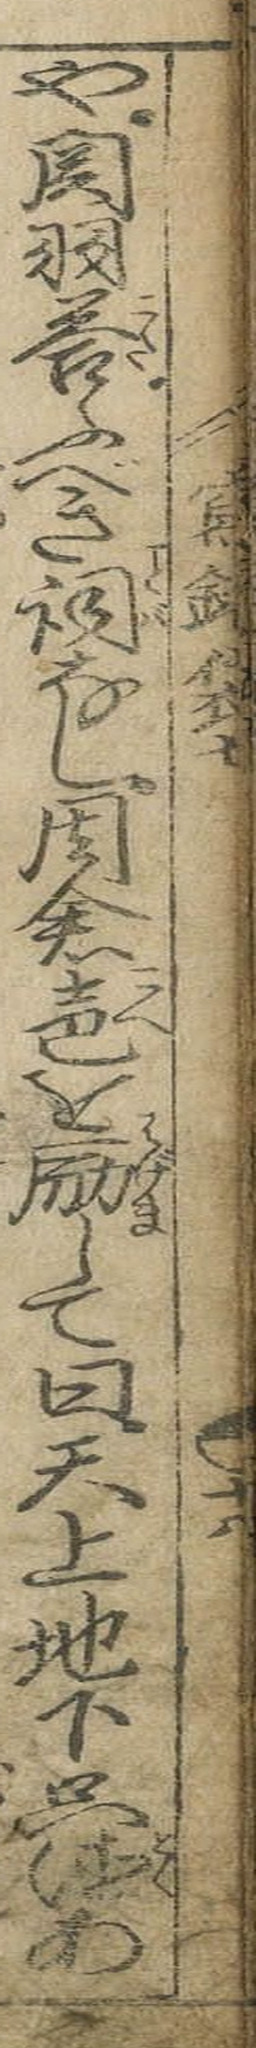や。関羽答ふべき詞なし。周倉声を励して曰。天上地下只徳あ
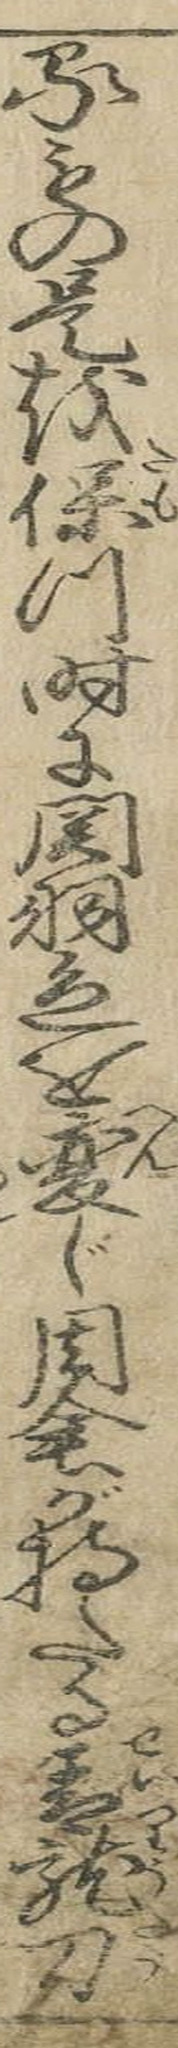るもの是を保つ時に関羽色を変じ周倉が持たる青龍刀
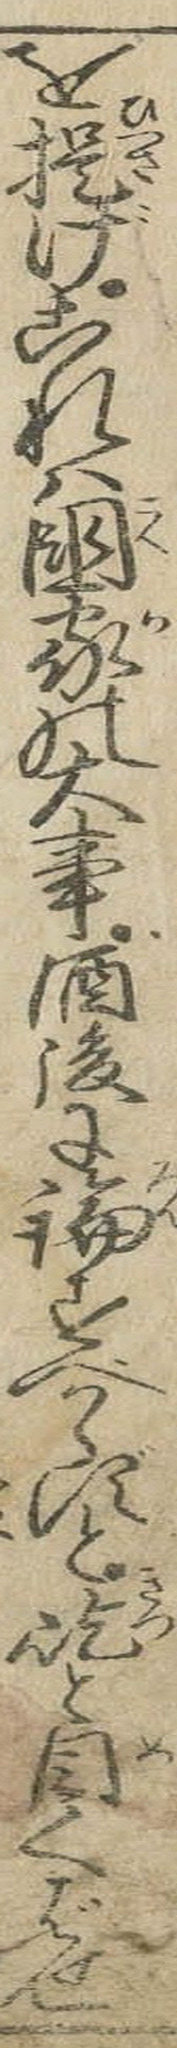を提げ。これは国家の大事。酒後に論すべからずと。屹と目くばせ
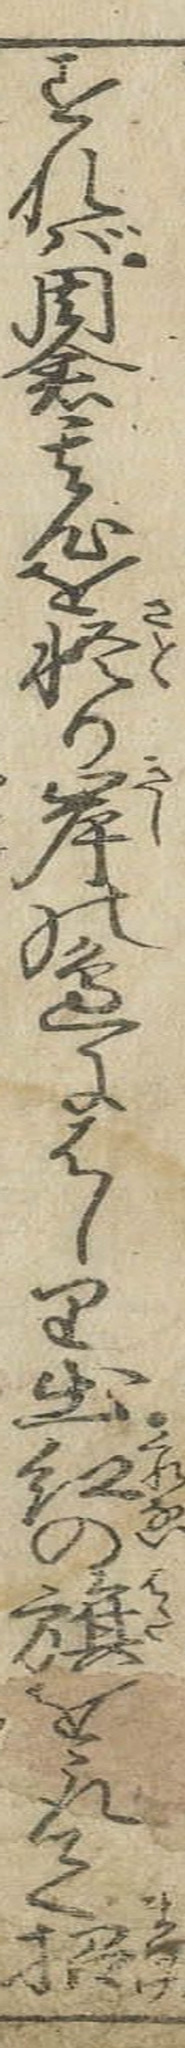すれば。周倉其心を悟り岸の辺にはしり出。紅の旗を取て招
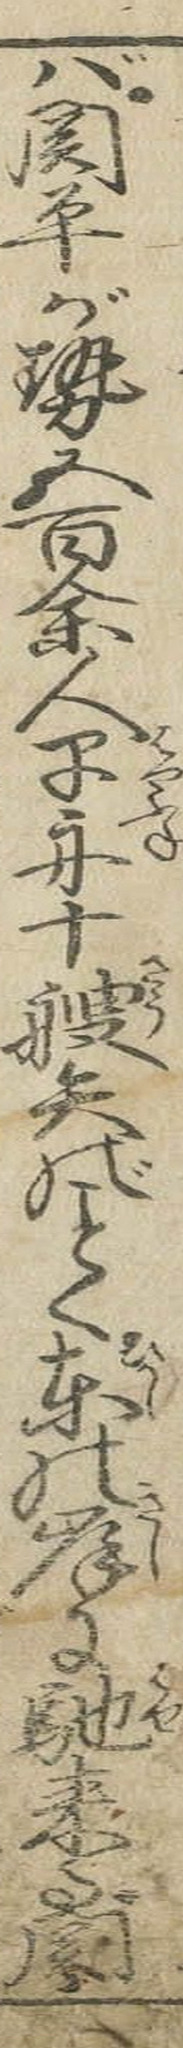ば。関平が勢五百余人早舟十艘矢のごとく東の岸に馳来る。関
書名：絵本写宝袋 9巻 7之巻
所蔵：東京学芸大学教育コンテンツアーカイブ
